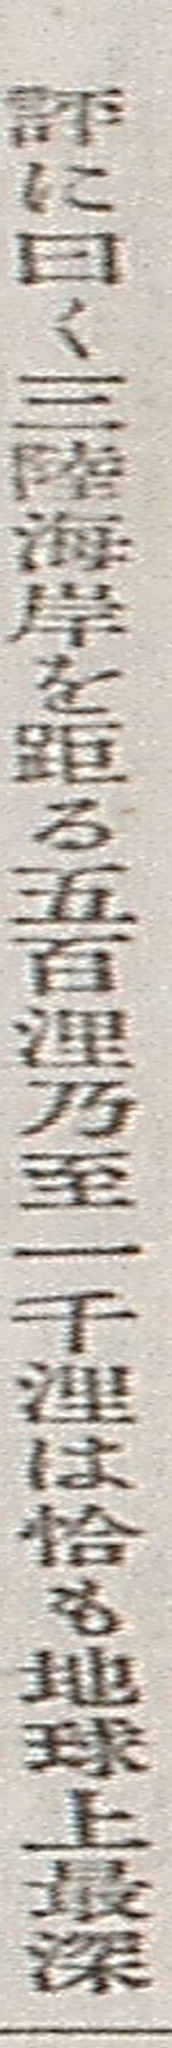評に曰く三陸海岸を距る五百浬乃至一千浬は恰も地球上最深
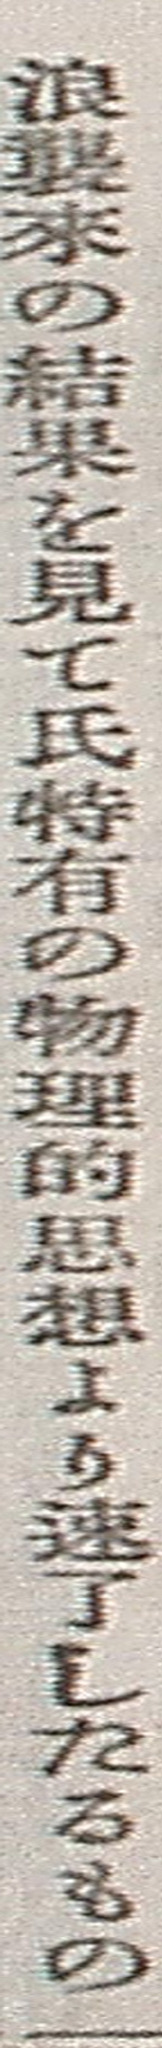浪襲来の結果を見て氏特有の物理的思想より速了したるもの
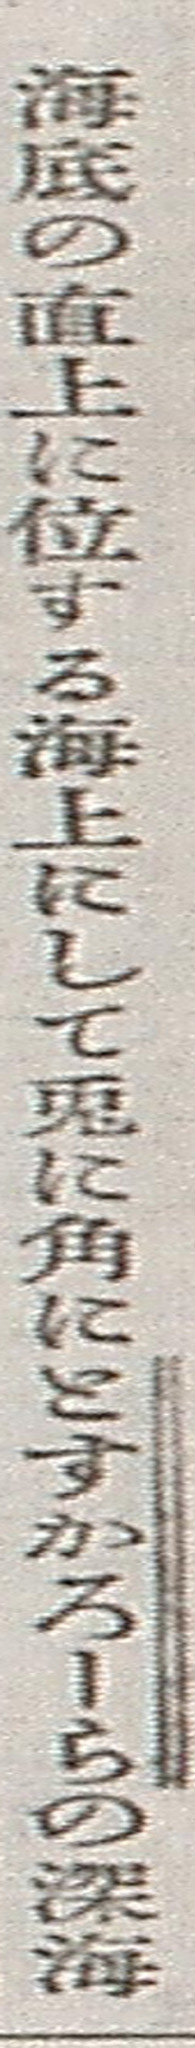海底の直上に位する海上にして兎に角にとすかろーらの深海
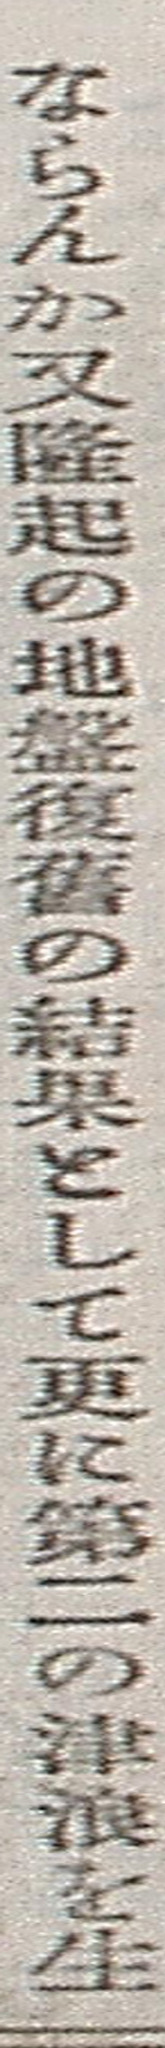ならんか又隆起の地盤復旧の結果として更に第二の津浪を生
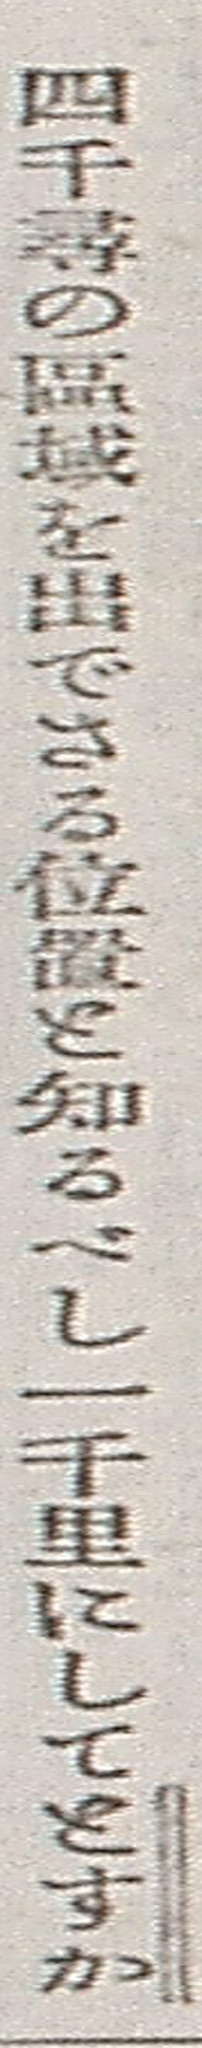四千尋の区域を出でさる位置と知るべし一千里にしてとすか
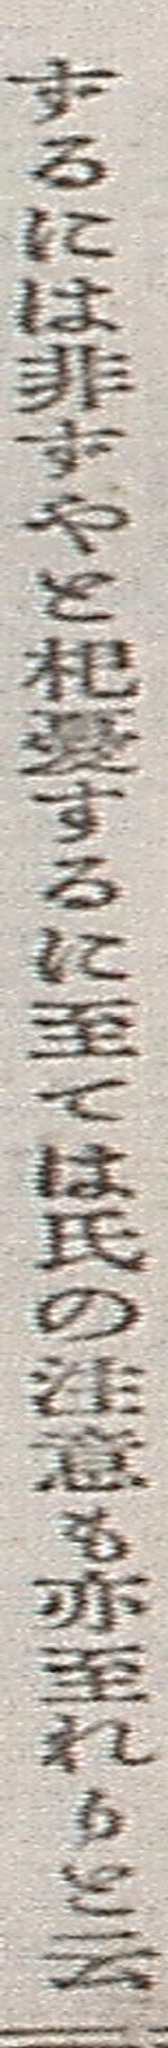ずるには非ずやと杞憂するに至ては氏の注意も亦至れりと云

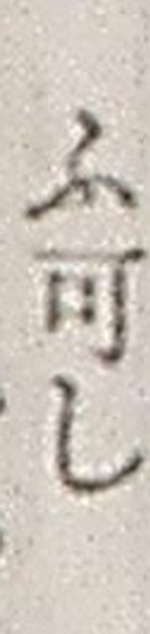ふ可し
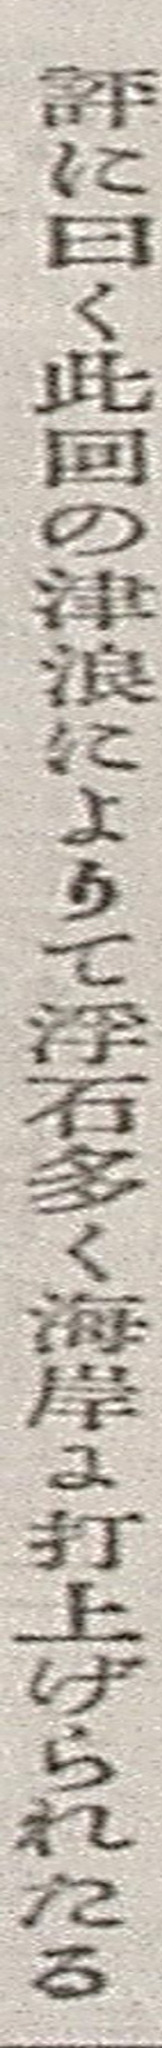評に曰く此回の津浪によりて浮石多く海岸に打挙げられたる
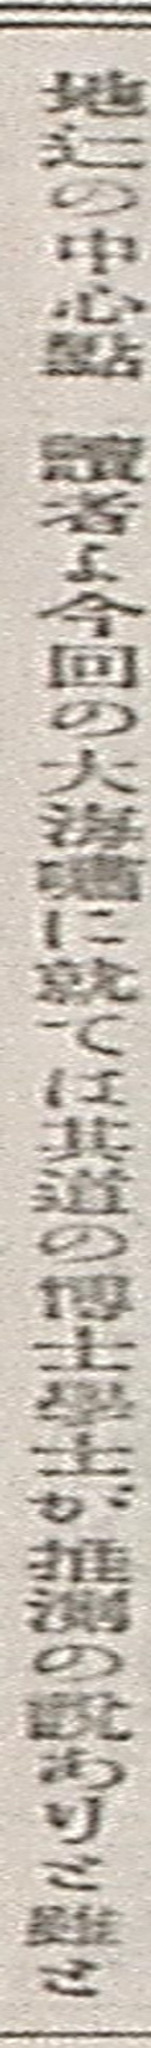地辷の中心点読者に今回の大海嘯に就ては其道の博士学士が推測の説ありと雖ど
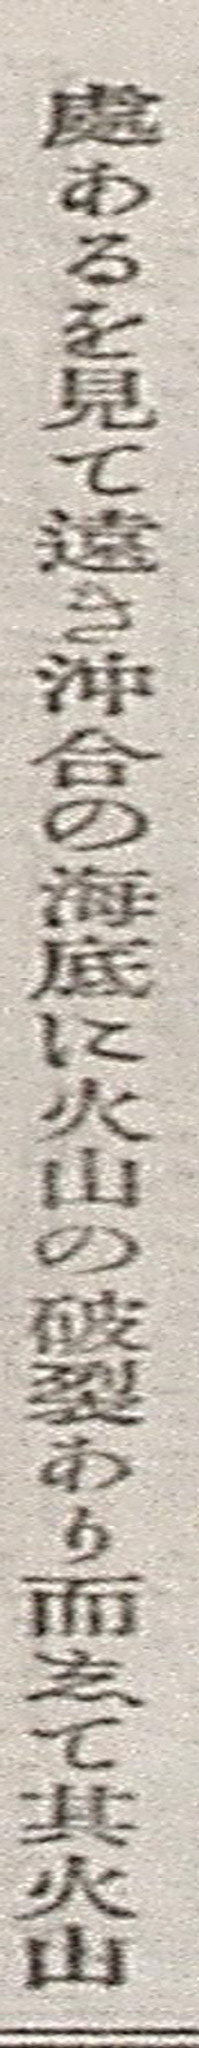処あるを見て遠き沖合の海底に火山の破裂あり而して其火山
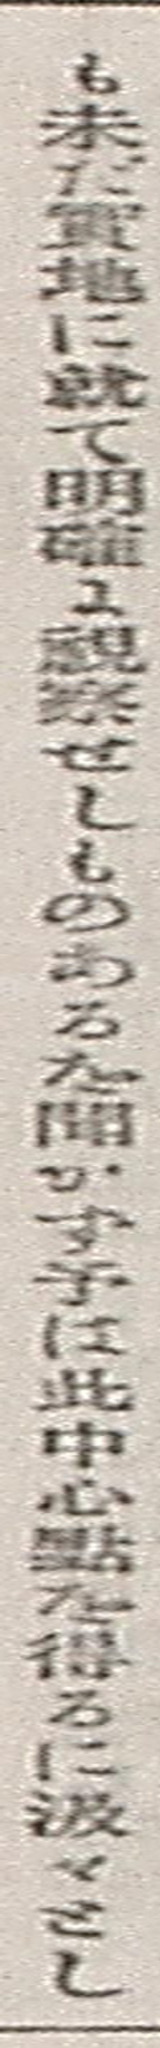も未だ実地に就て明確に観察せしものあるを聞かず予は此中心点を得るに汲々とし
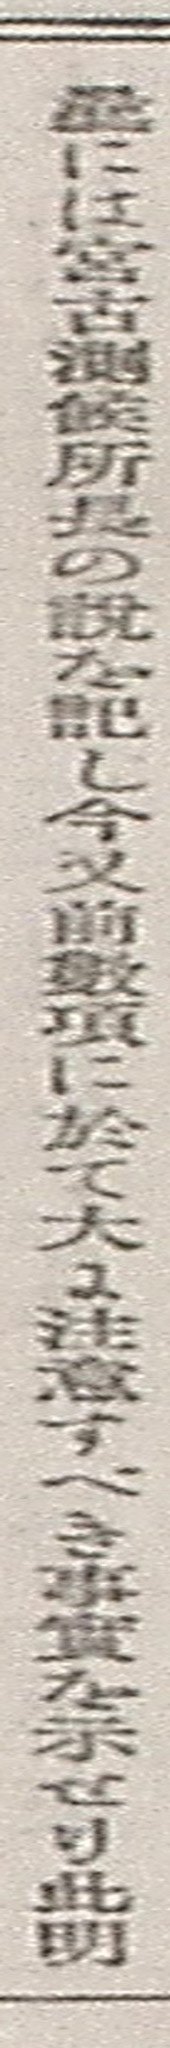曩には宮古測候所長の説を記し今又前数項に於て大に注意すべき事実を示せり此明
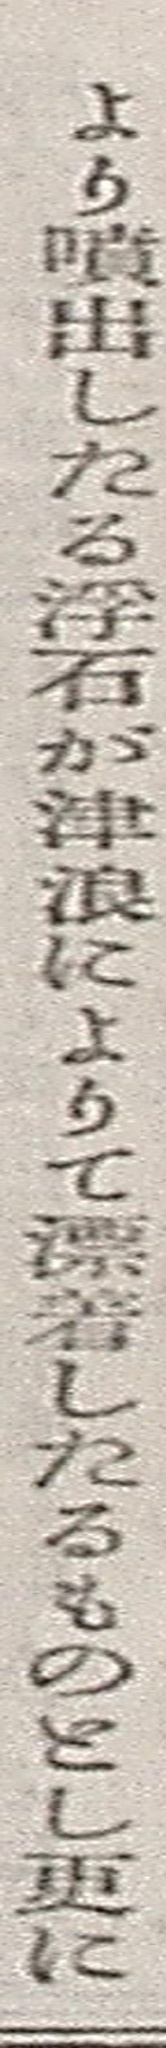より噴出したる浮石が津浪によりて漂着したるものとし更に
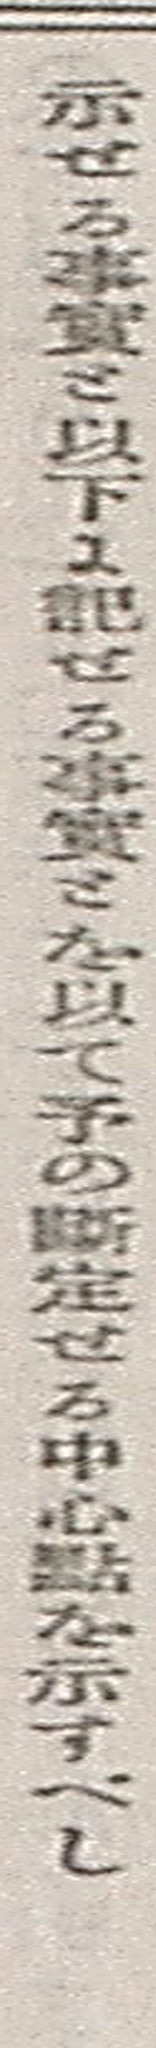示せる事実と以下に記せる事実とを以て予の断定せる中心点を示すべし
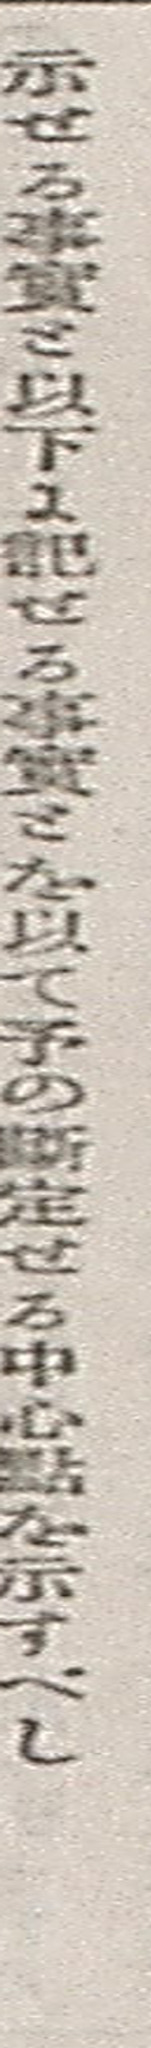示せる事実と以下に記せる事実とを以て予の断定せる中心点を示すべし
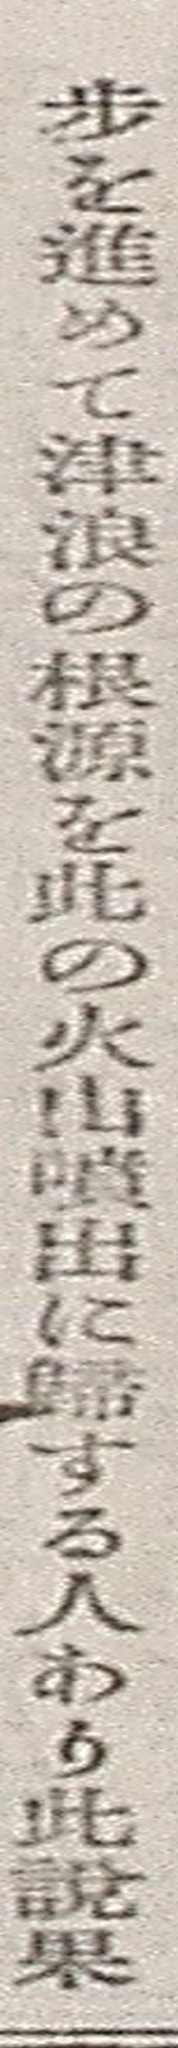歩を進めて津浪の根源を此の火山噴出に帰する人あり此説果
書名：風俗畫報臨時増刊第百十九號　大海嘯被害録（中）
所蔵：東京大学地震研究所図書室 Earthquake Research Institute Library, The University of Tokyo, JAPAN
